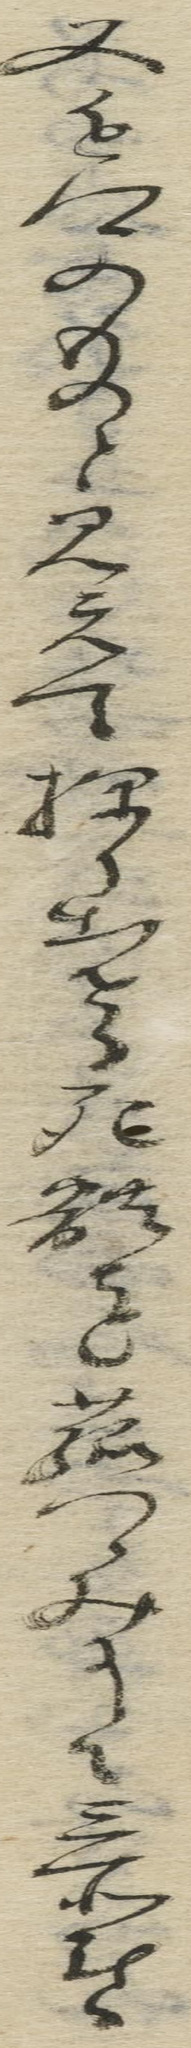又近郷のものと見えて探り出をる死骸を菰つゝみにして三所計り
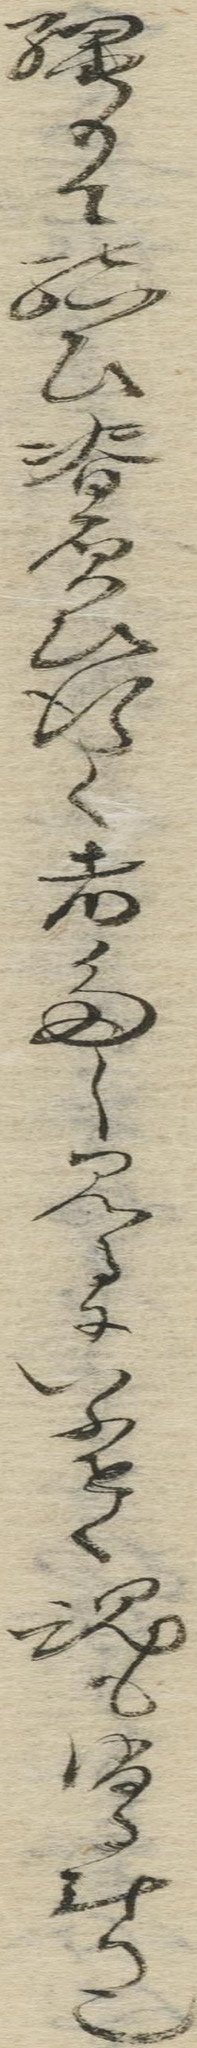縛りて結ひ背負ひ行く者多し見るにいふをく魂も消る計り也
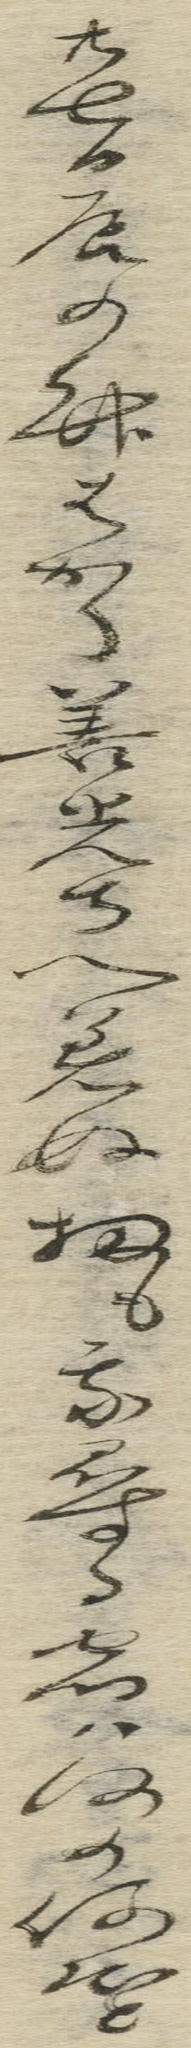廿七日辰の刻はかり善光寺へ着ぬ扨も我尋る者ハ何の何そと
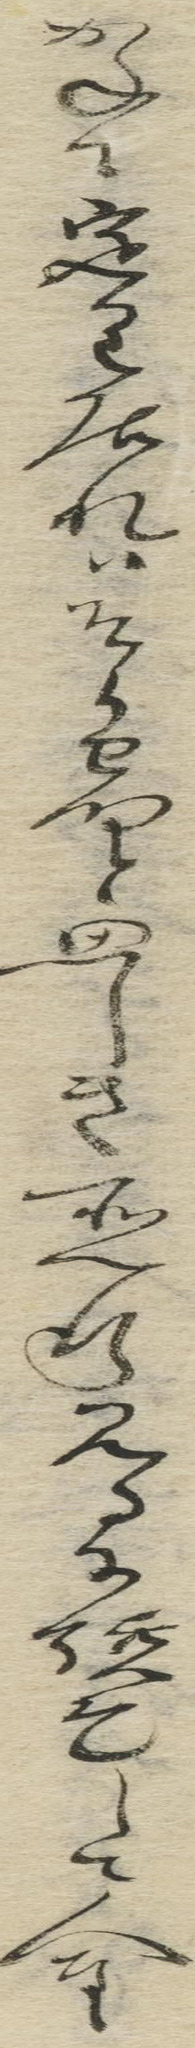かねて定り居れハそり宿と思しき所へ行見るに焼亡して人なし
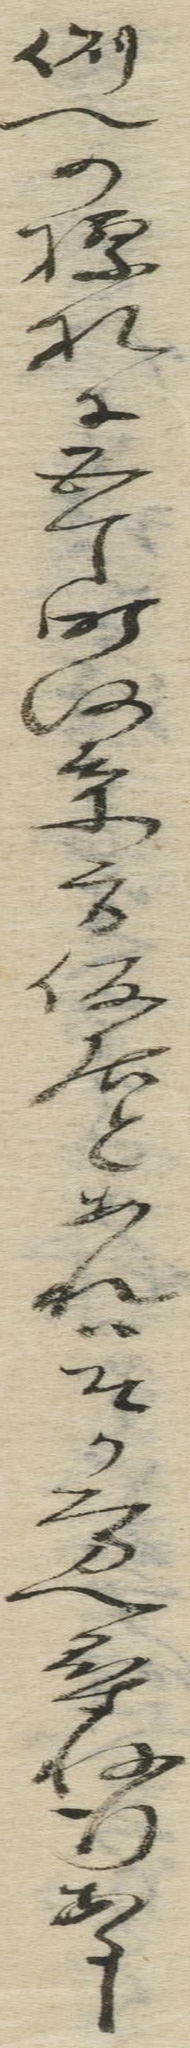側への標札に五丁町何某方仮居とあれハそか方へ尋ね行あるし
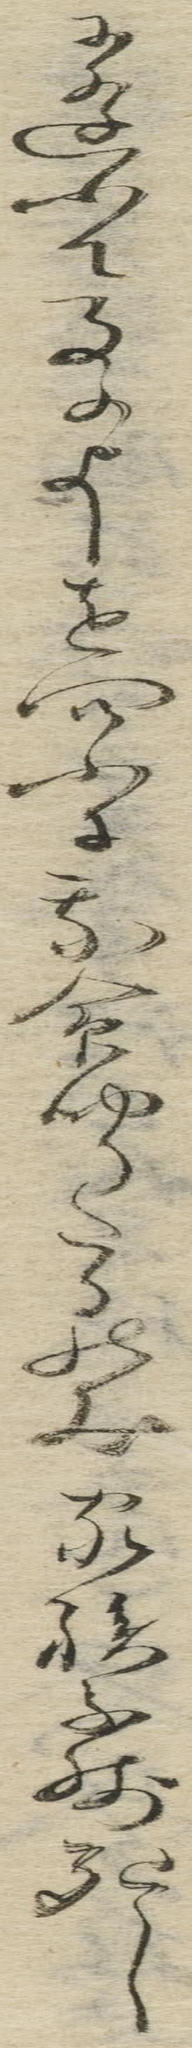に逢ふて事のよしを問ふに我命助りたるのみ家族不残死し
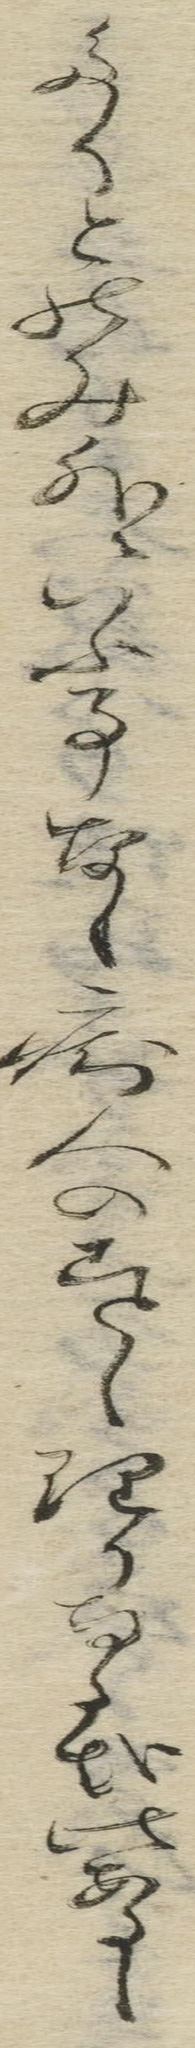たりとのみ外二いふ事なし痴人のことし現りなる哉此あるし
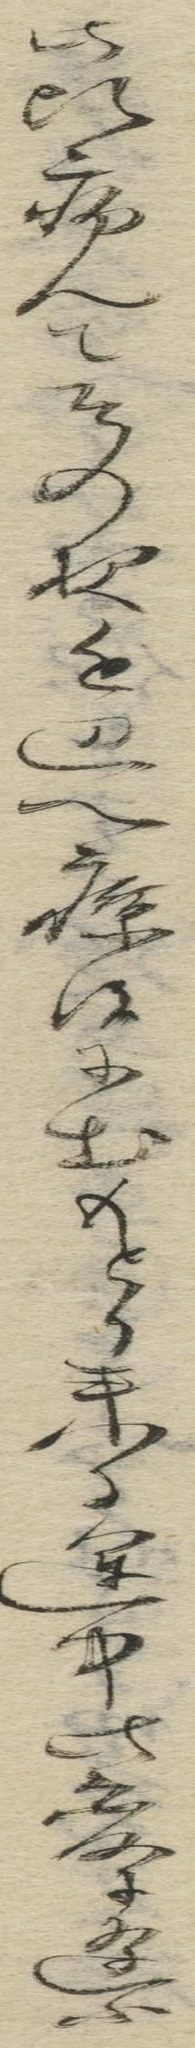此頃痴人とその夜近辺へ療行に出もとり来る途中此変に逢ふ
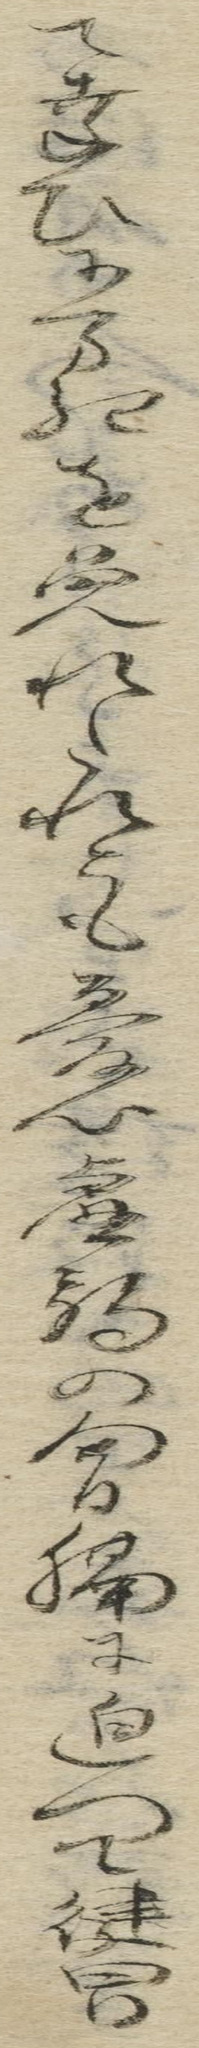て幸ひに万死を免れたれとも急なん虚弱の旬日腸に迫つて徤冒
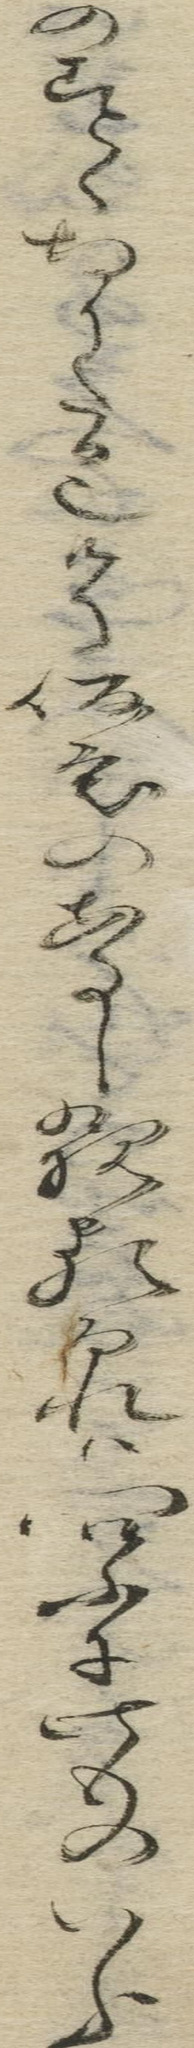のことくなりたる也けり仮宅のあるし親類なれハ問ふに此ものいふ

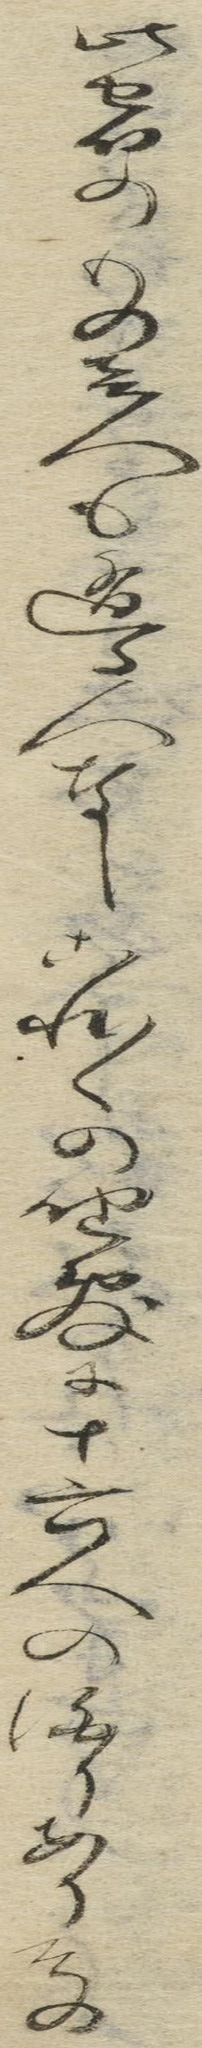此宿のもの壱人も遁る人なしこれ〳〵の坐敷に十六人の泊りありその
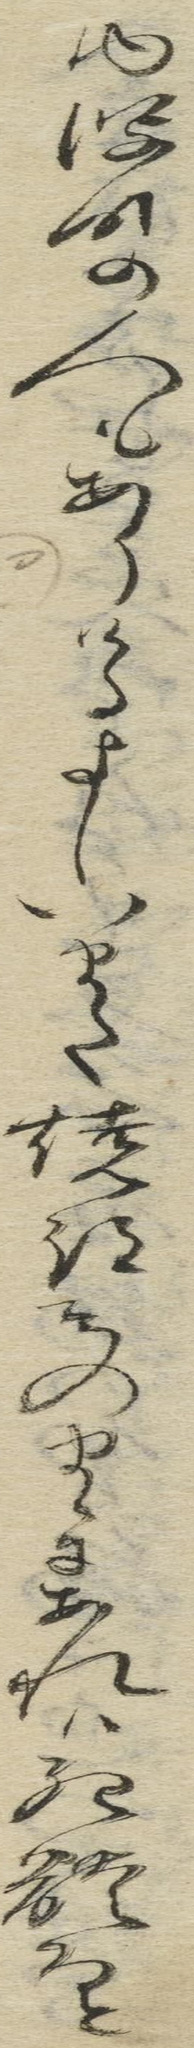内潟町の人もありたるよしいまた焼跡そのまゝあれハ死體なと
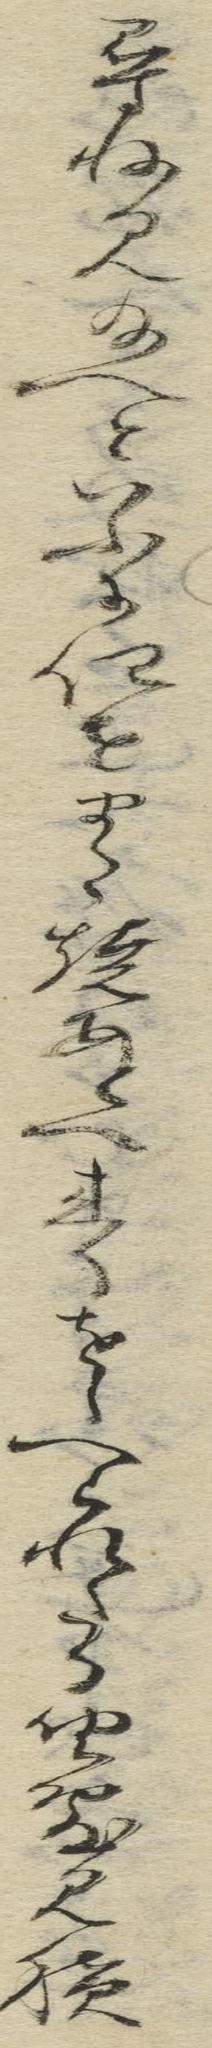尋ね見給へといふに任せまた焼あとへ参りをしへられたる坐敷見積
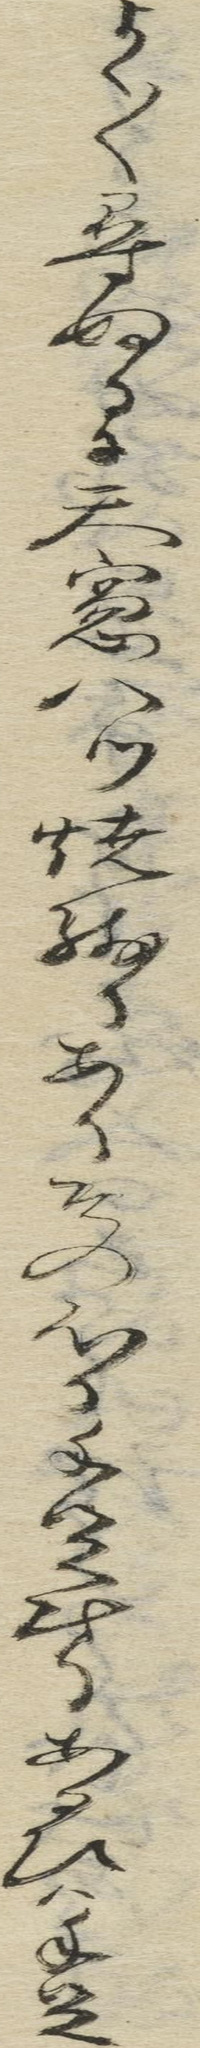よく〳〵尋ぬるに天窓八ッ焼残りありそのなか手足計りあるひハ手足
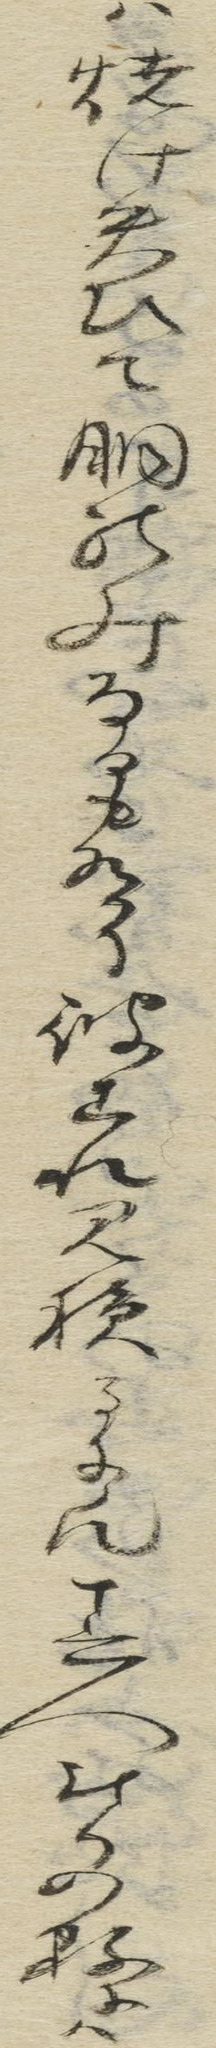ハ焼け失ひて胴のみなるも有り彼これ見積るに凡十六人計りの数にハ
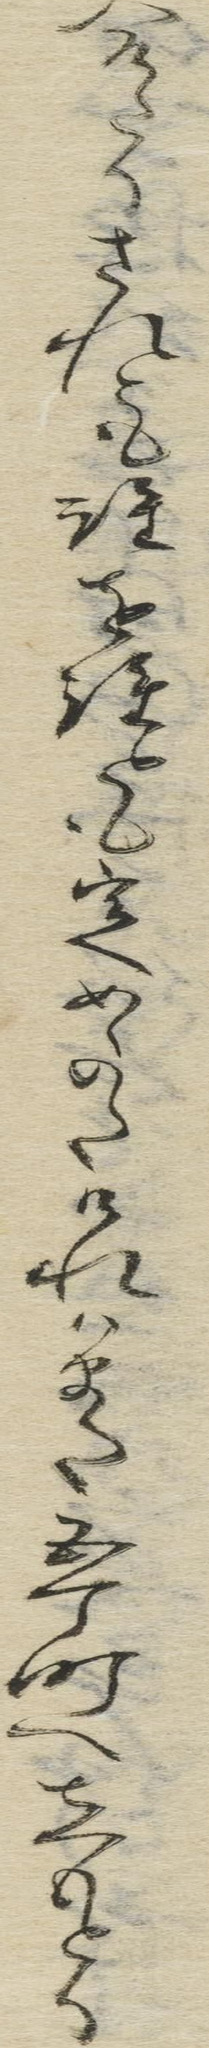合たりされとも誰を誰とも定めかたくけれハまた五丁町へ立もとり
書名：弘化丁未天變日記
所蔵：東京大学地震研究所図書室 Earthquake Research Institute Library, The University of Tokyo, JAPAN
